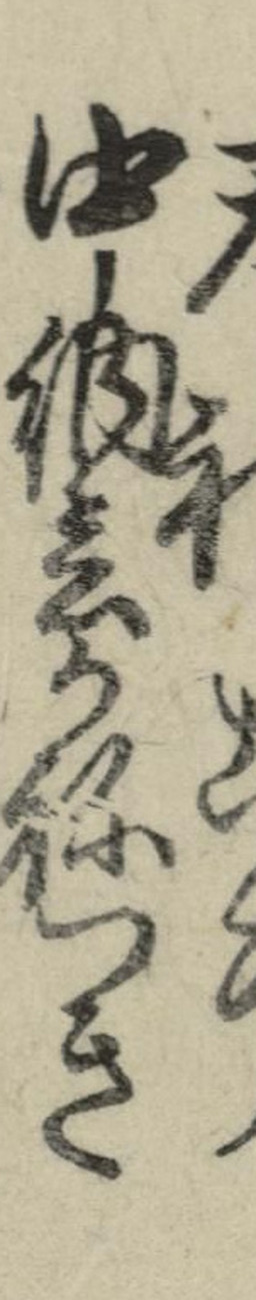中納言かねつき
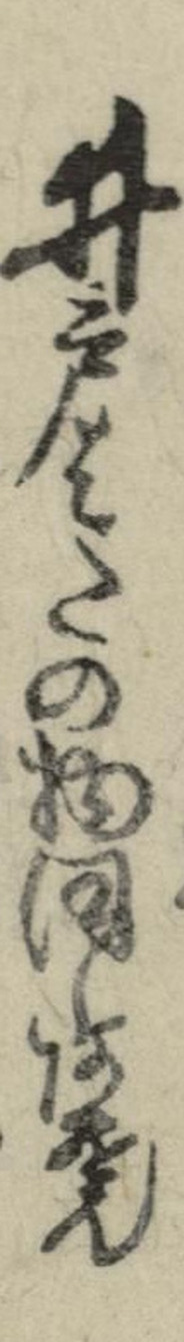井戸はたの物つあそん
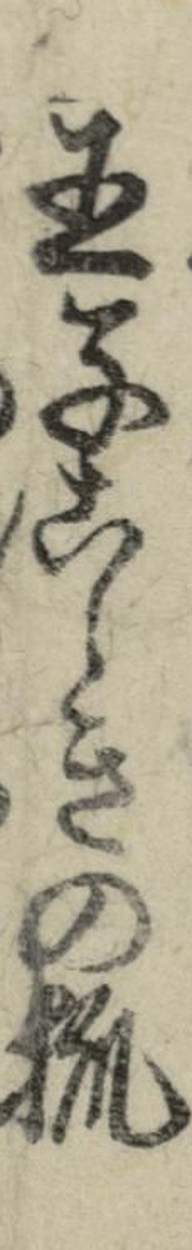王子こしきの狐
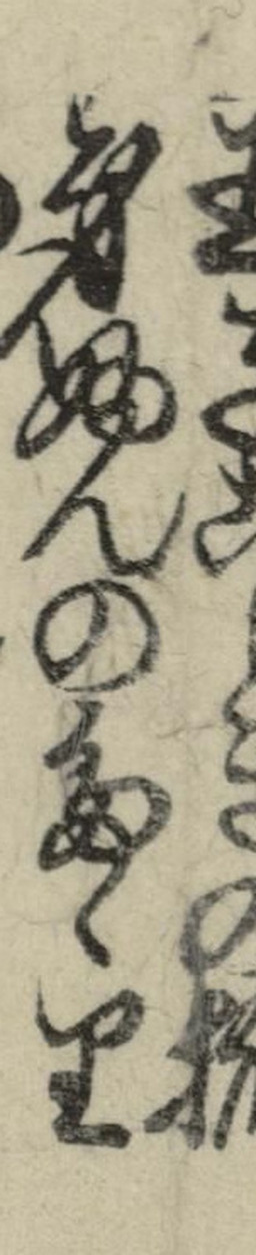身ふんのたゝり
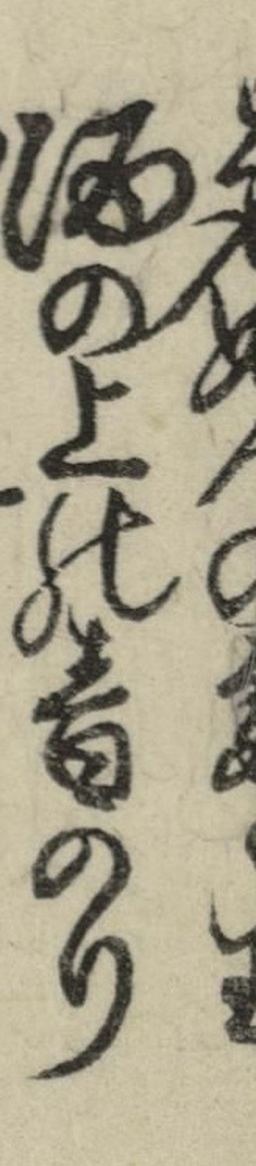酒の上の青のり
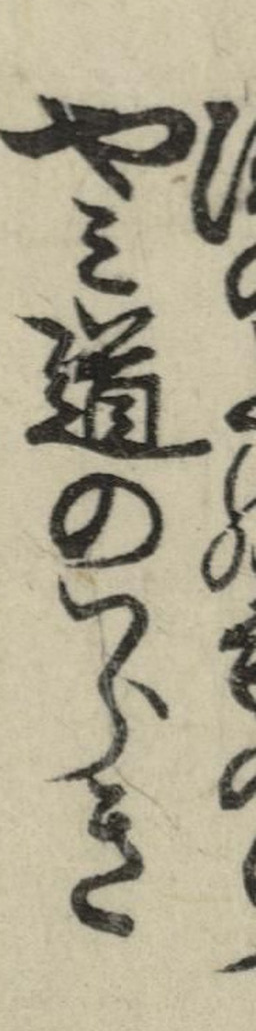やみ道のいらき
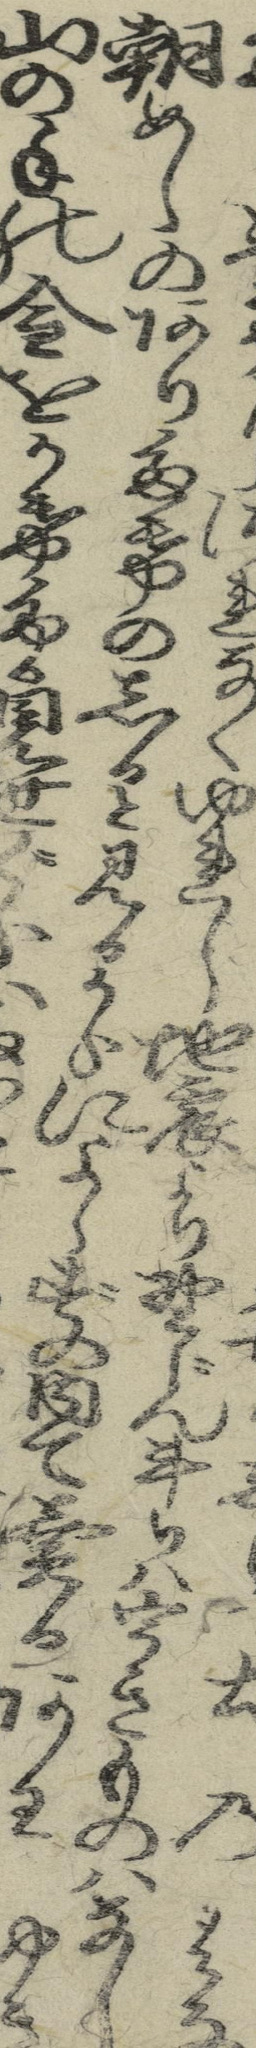朝めしのありたけのしると見るからによしずの内て売るあわゆき
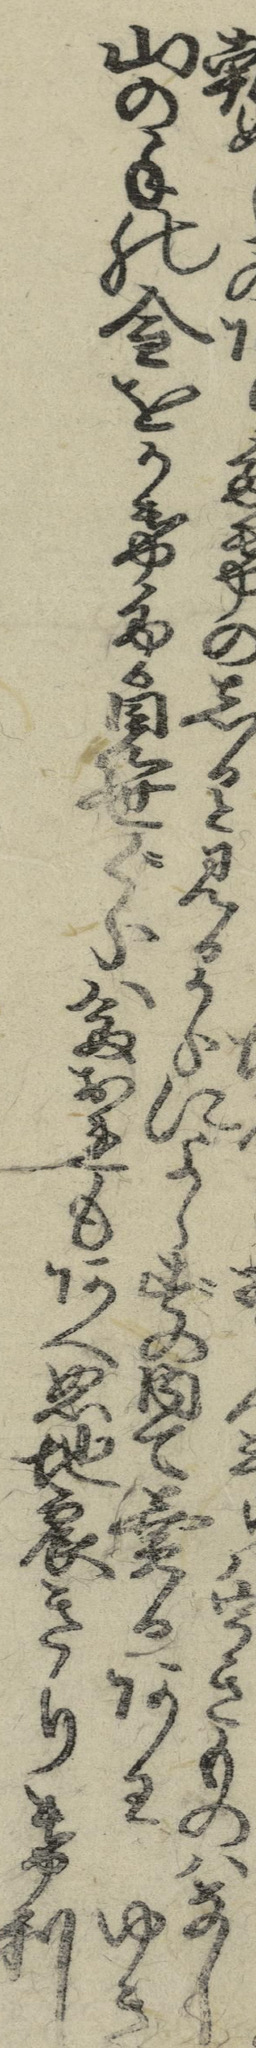山の手の金をかけたる見世ぐらはたおれもあへぬ地震きりけり
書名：泰平の美世鹿島百人一首
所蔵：東京大学地震研究所図書室 Earthquake Research Institute Library, The University of Tokyo, JAPAN
